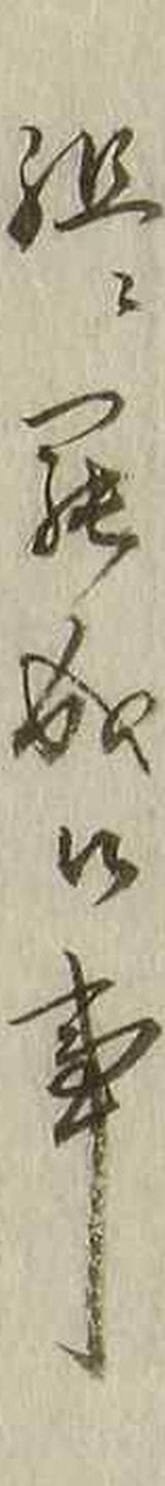組ニ罷成候事
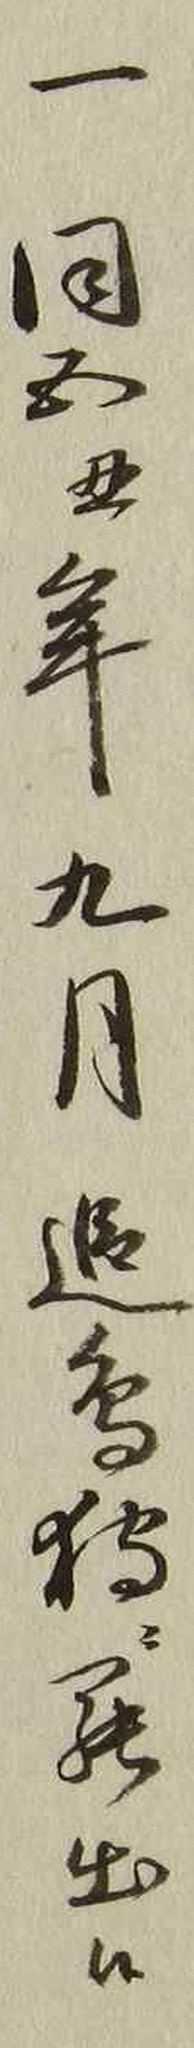一同五丑年九月追鳥狩ニ罷出候
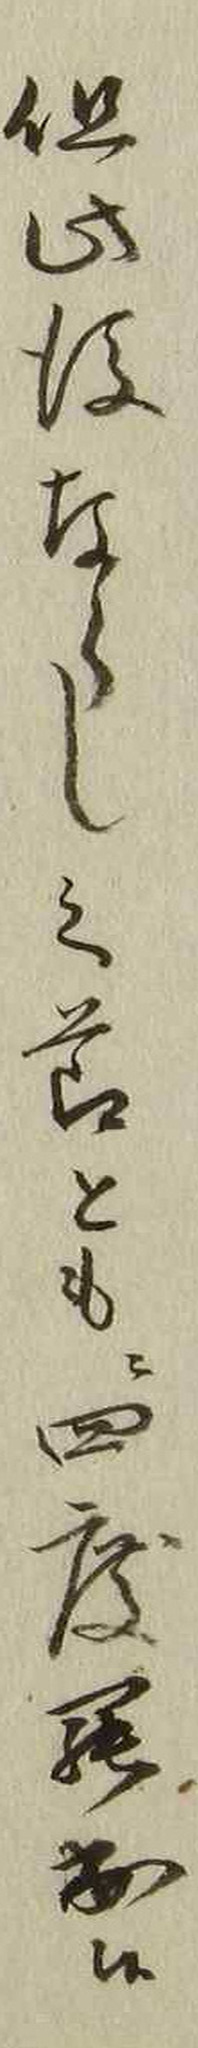組此後ならし之節ともニ四度罷出候
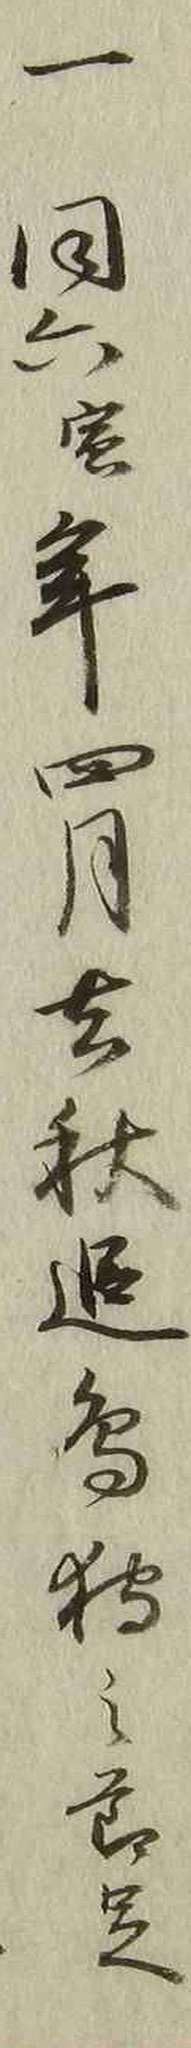一同六寅年四月去秋追鳥狩之節足
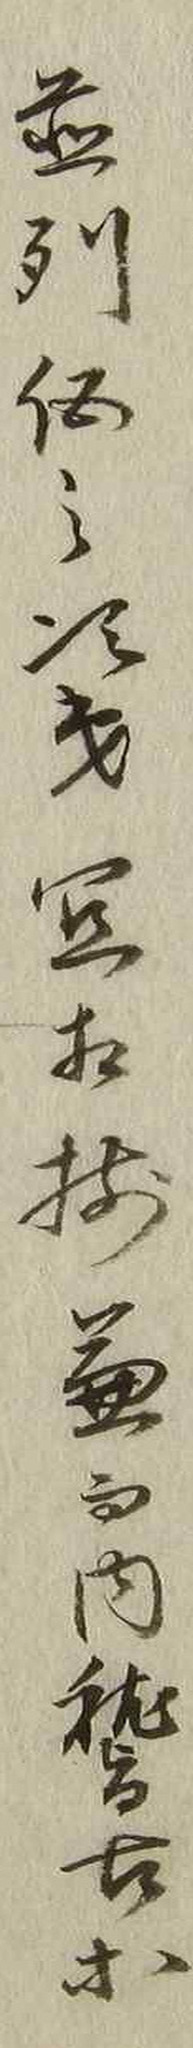並列伍之次弟宜相揃兼而内稽古等
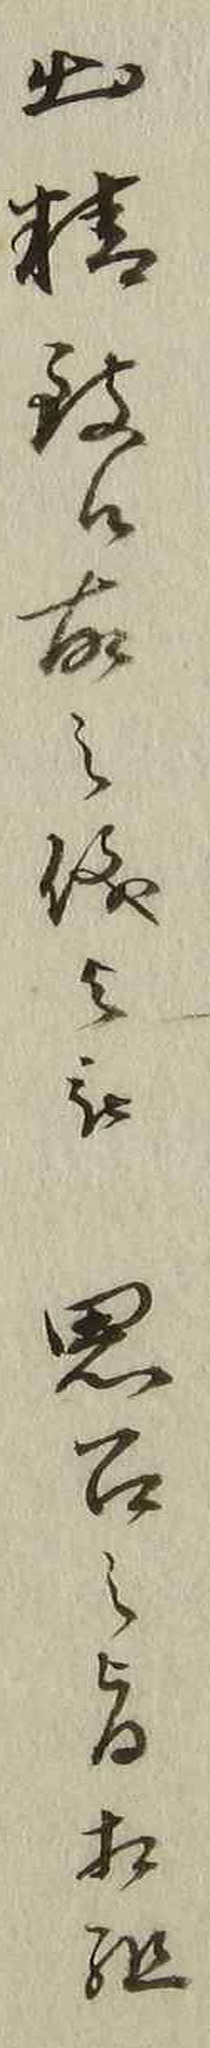出精致候故之儀与被思召之旨相組
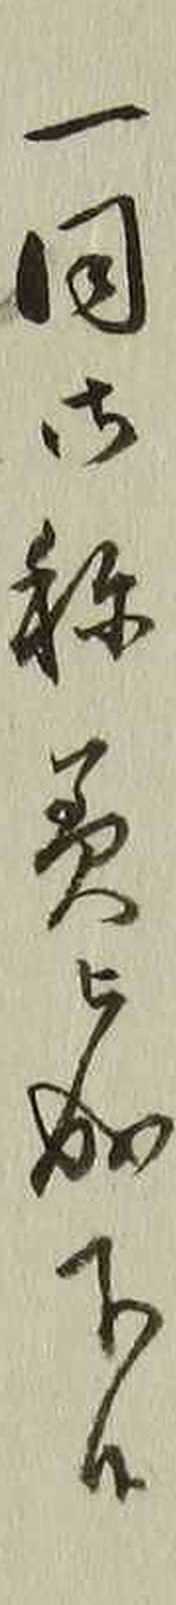一同御称美被成下候
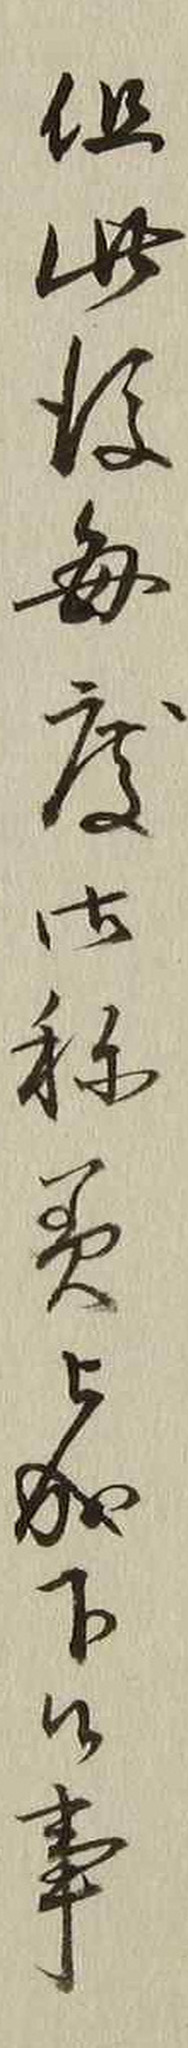但此後毎度御称美被成下候事
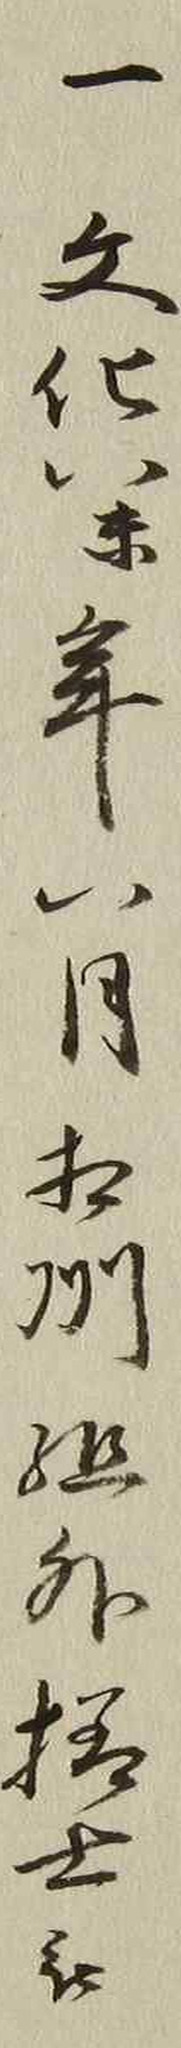一文化八未年八月相州組外様士被
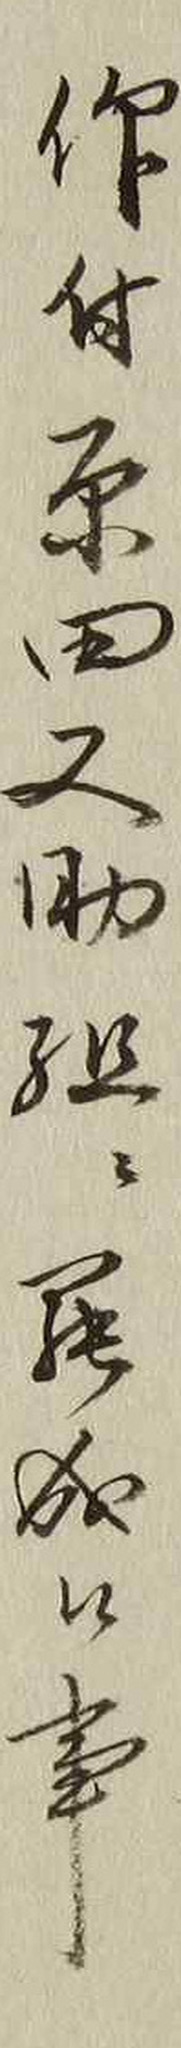仰付原田又助組ニ罷成候事
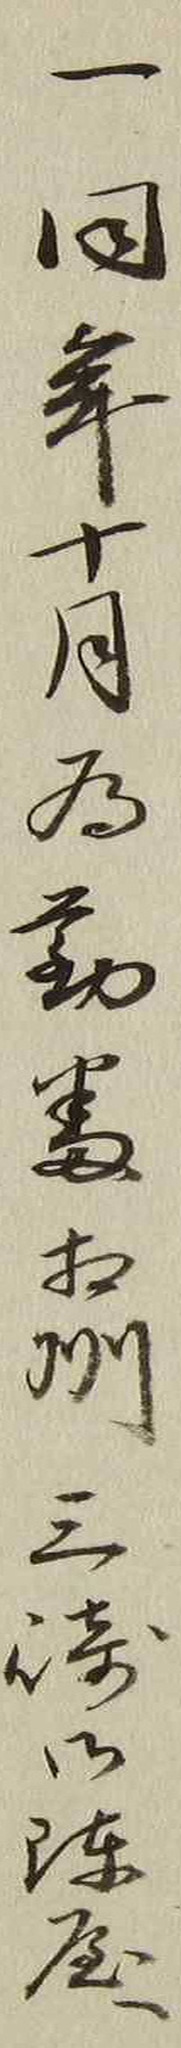一同年十月為勤番相州三崎御陣屋へ
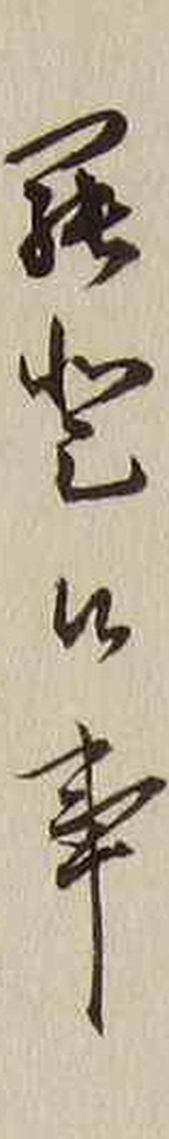罷登候事
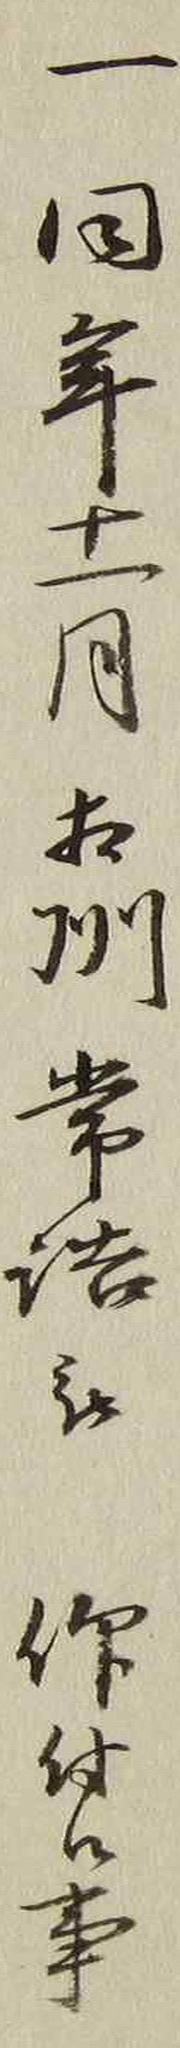一同年十一月相州常詰被仰付候事
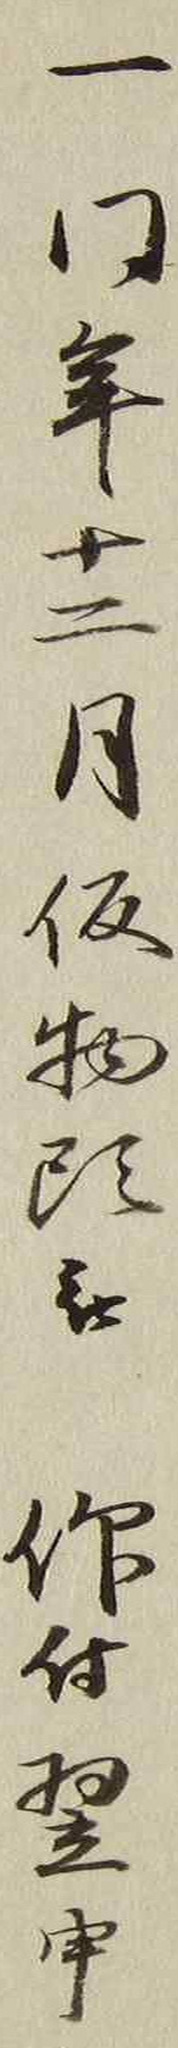一同年十二月仮物頭被仰付翌申
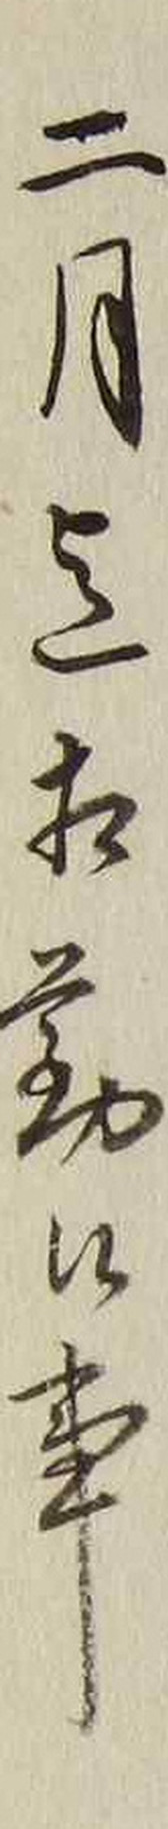二月迄相勤候事
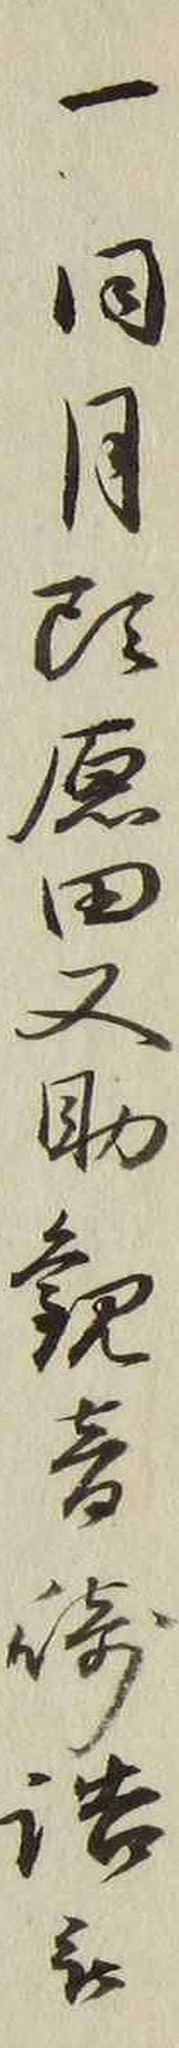一同月頭原田又助観音崎詰被
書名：諸士系譜　巻之128　た之部4
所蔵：会津若松市立会津図書館
